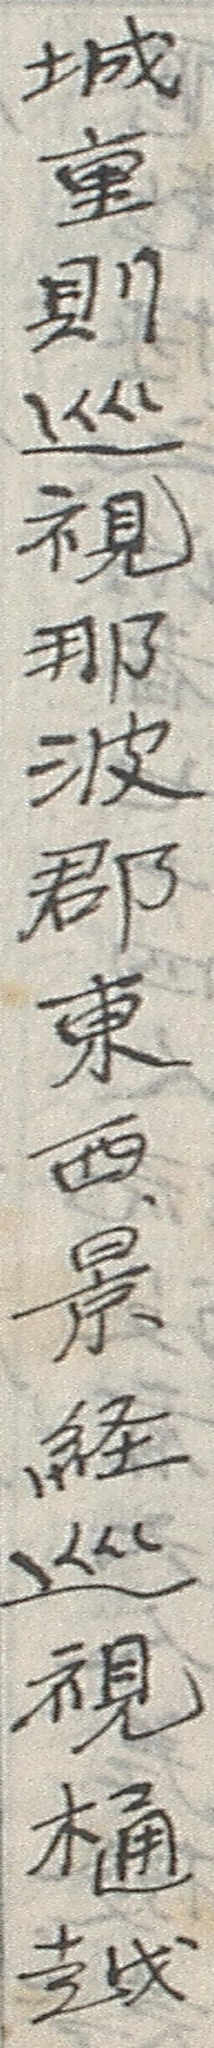城重即巡視那波郡東西、景経巡視樋越
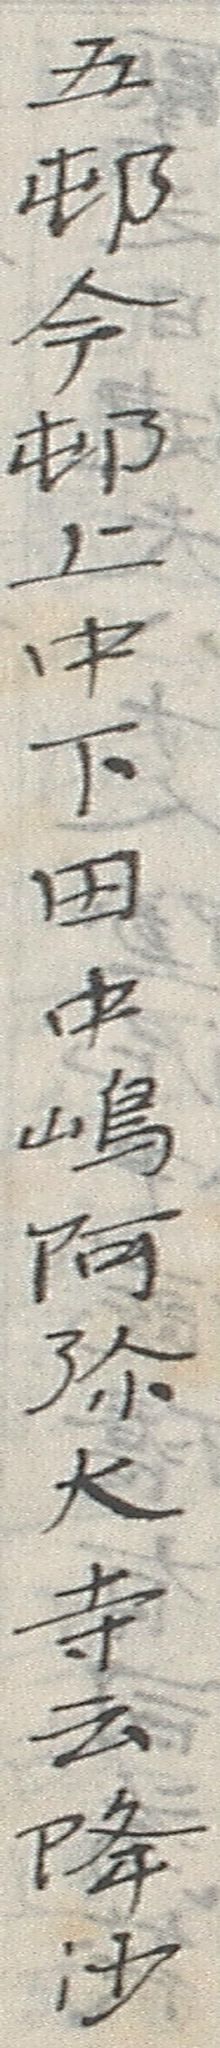五邨今邨上中下田中嶋阿弥大寺云降沙
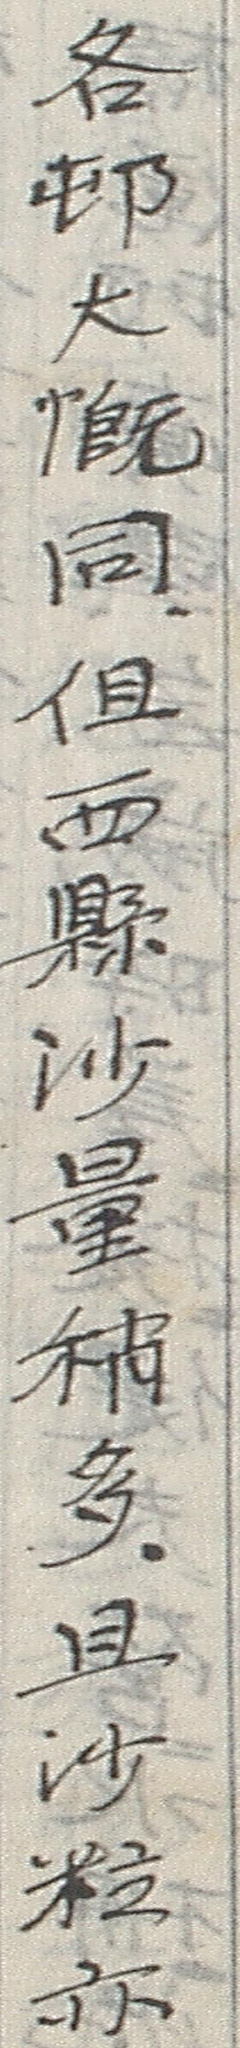各邨大概同、但西県沙量稍多、且沙粒亦
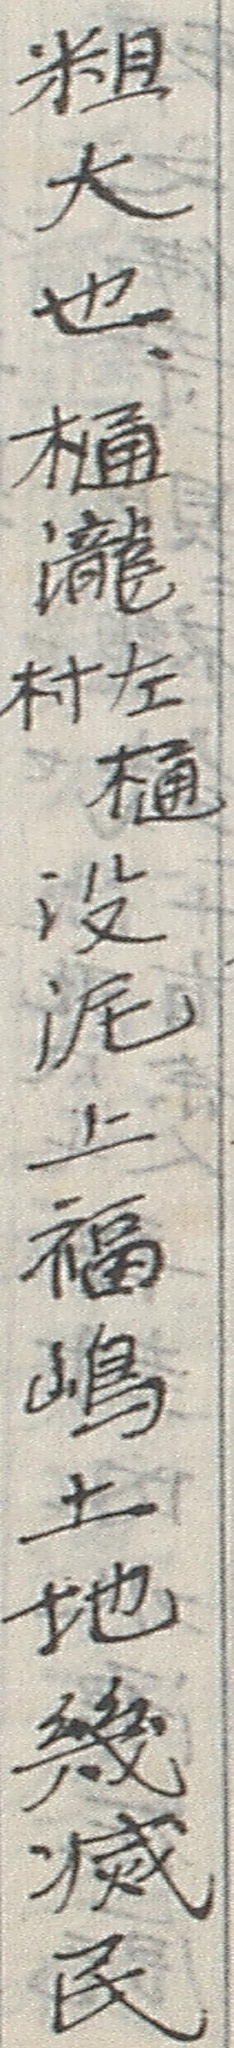粗大也、樋瀧左樋村没泥上福嶋土地幾度民
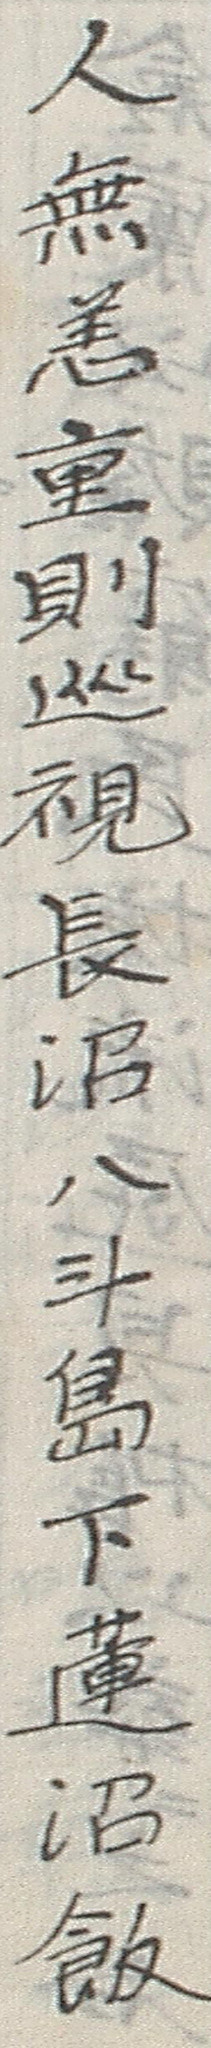人無恙重則巡視長沼八斗島下蓮沼飯
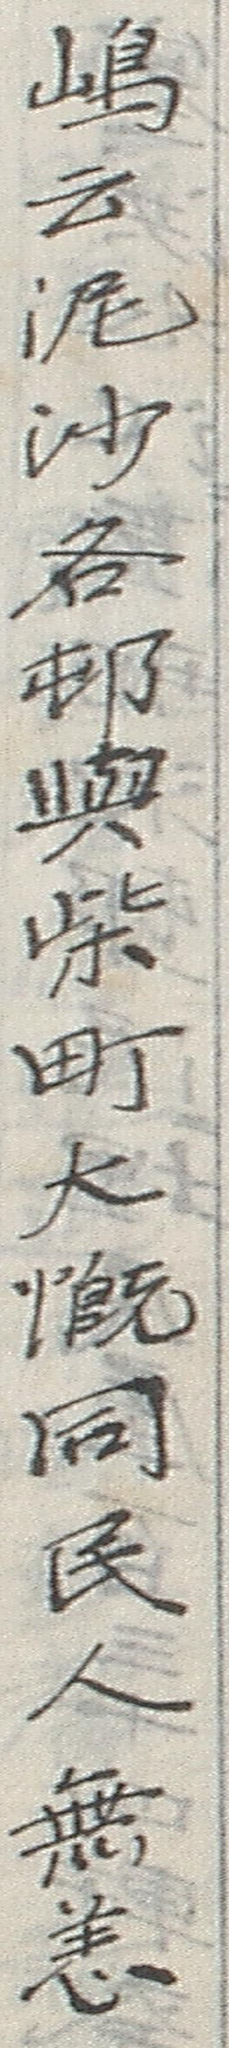嶋云泥沙各邨与柴町大概同民人無恙
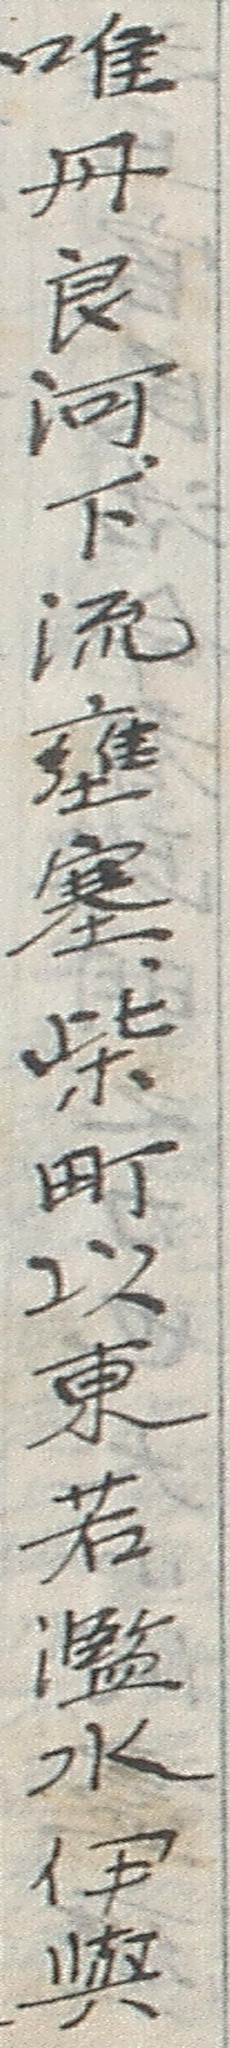唯丹良河、下流壅塞、柴町以東若濫水伊与

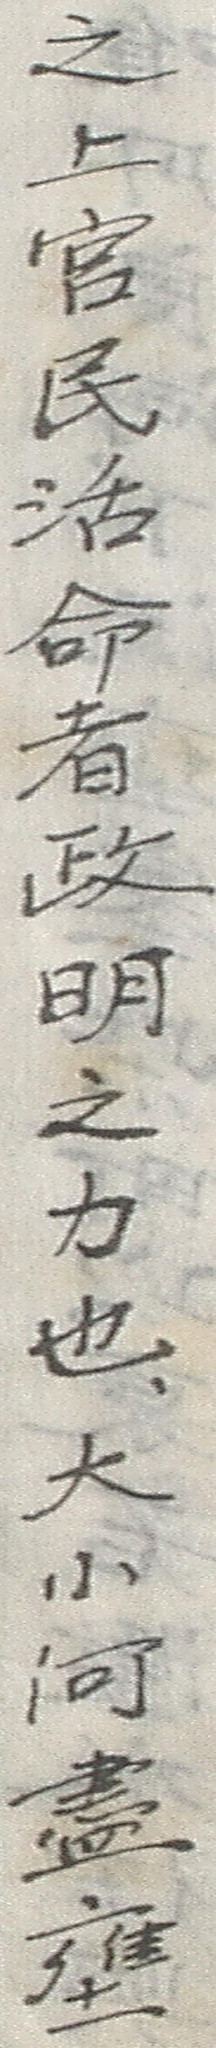之上官民活命者政明之力也、大小河盡壅
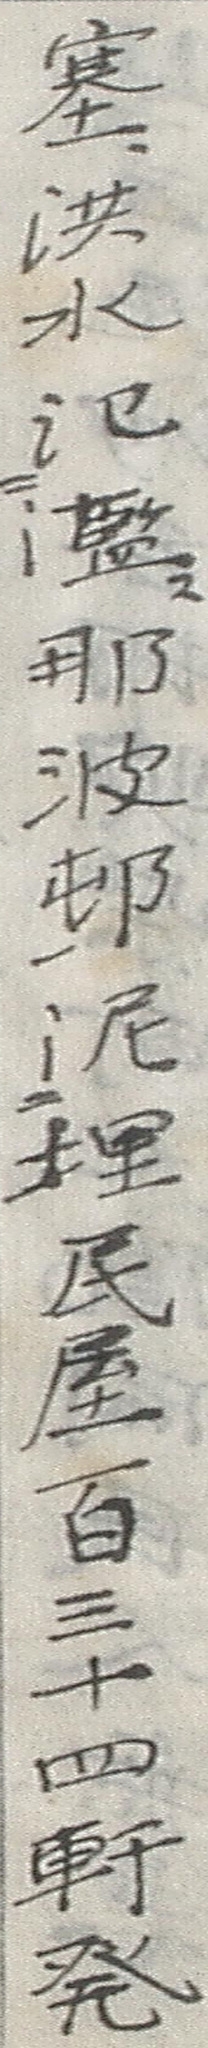塞、洪水氾濫那波邨泥埋民屋百三十四軒発
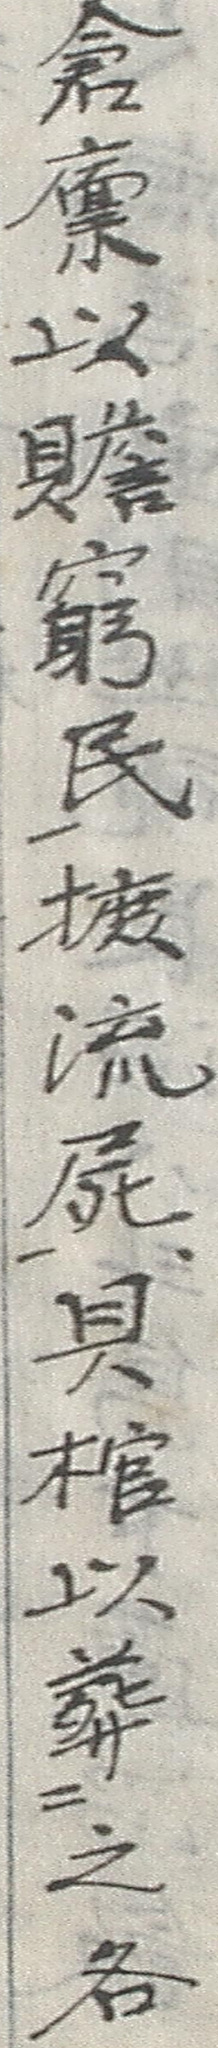倉廩以贍窮民摝流屍、貝棺以葬之各
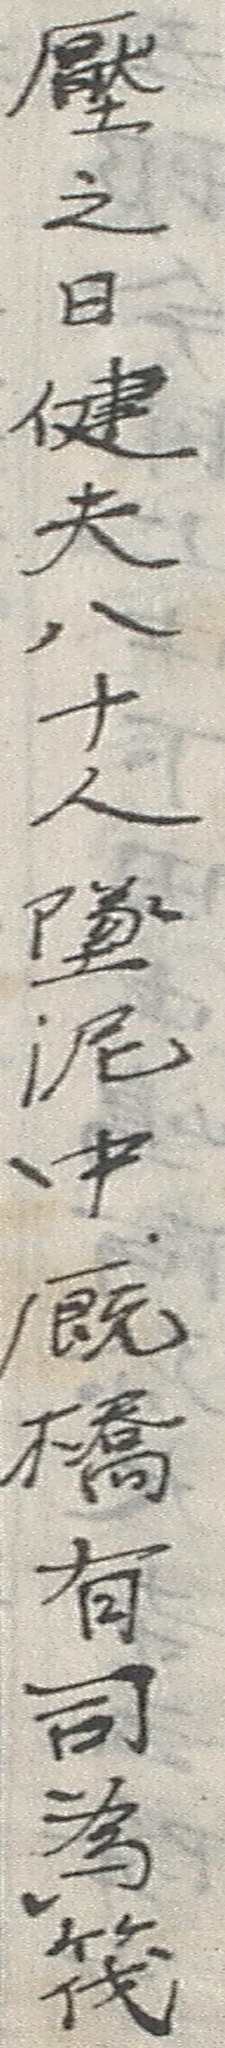圧之日健夫八十人墜泥中、厩橋有司為筏
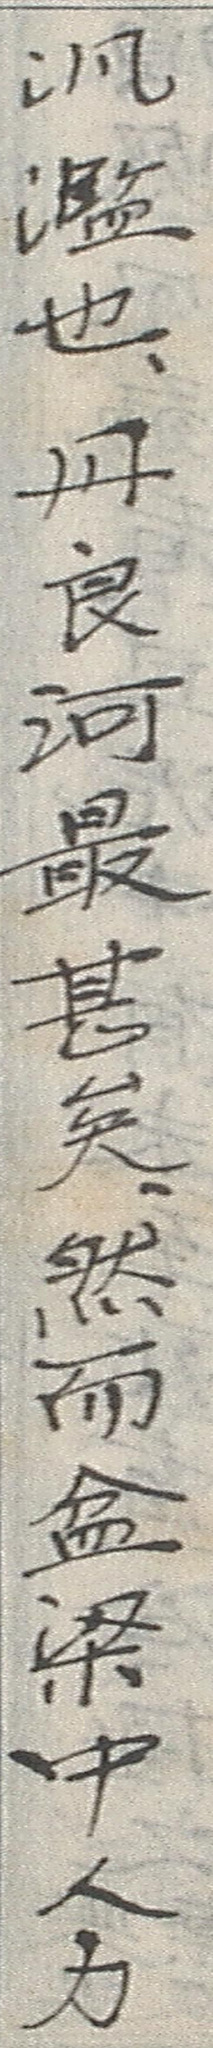氾濫也、丹良河最甚矣、然而盆梁中人力
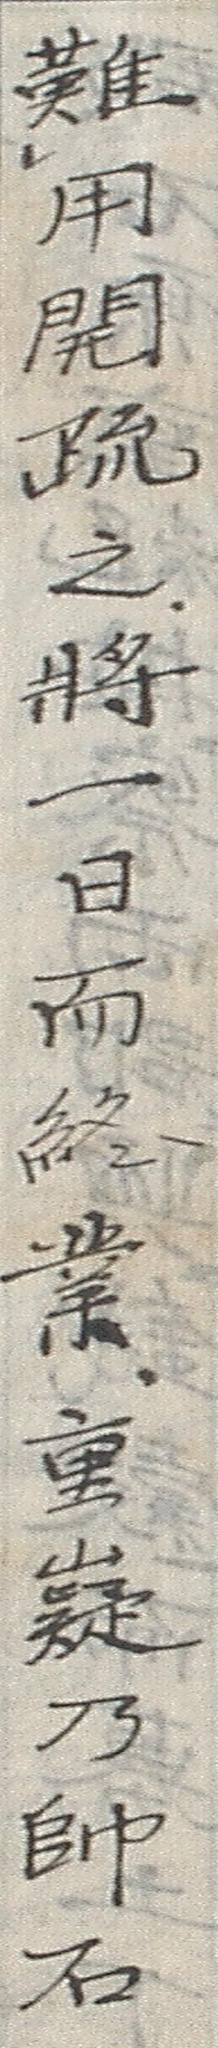難用開疏之、将一日而終業、重嶷乃帥石
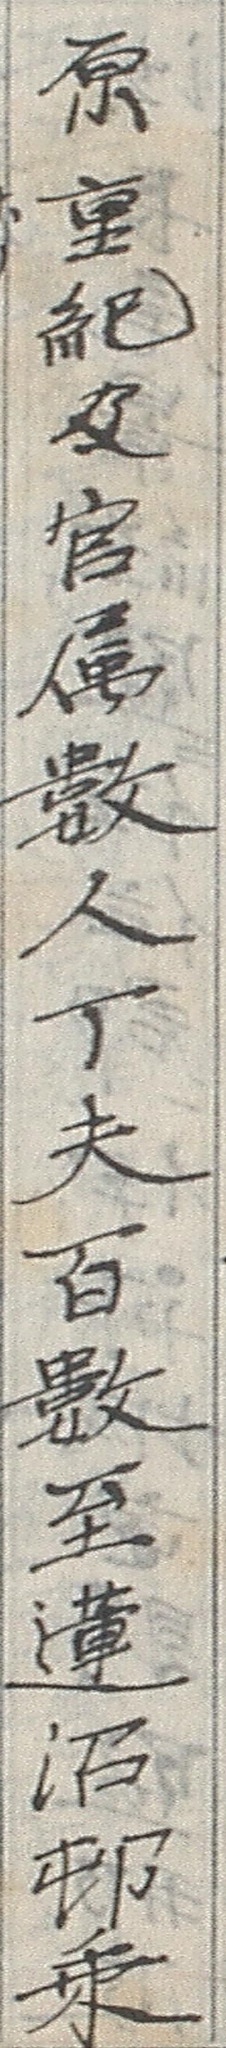原重紀及官属数人丁夫百数至蓮沼邨乗
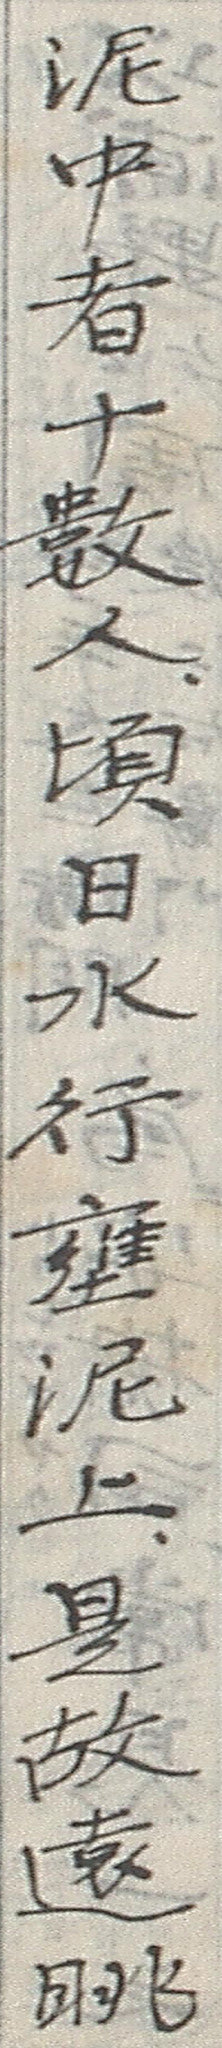泥中者十数人、頃日水行壅泥上、是故遠眺
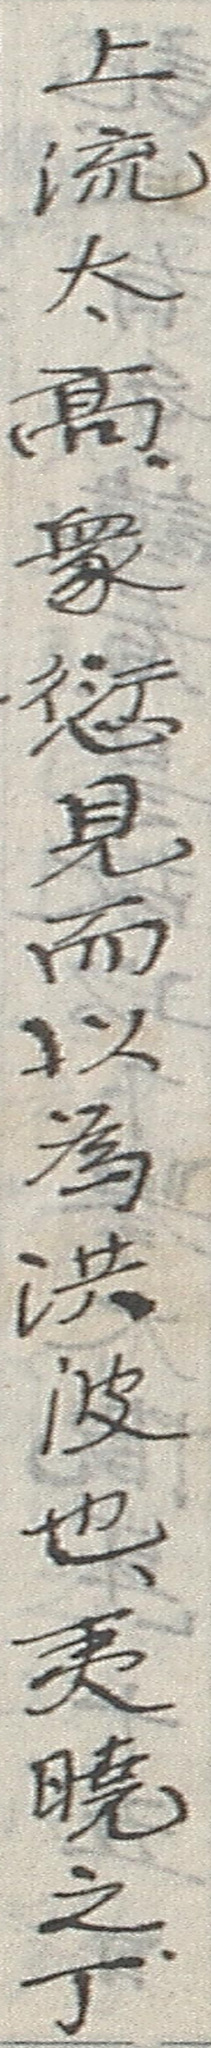上流太高、衆愆見而以為洪波也、夷暁之、丁
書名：天明三年癸卯六月　沙降記　［蕗原拾続巻之五十二］
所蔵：東京大学地震研究所図書室 Earthquake Research Institute Library, The University of Tokyo, JAPAN
